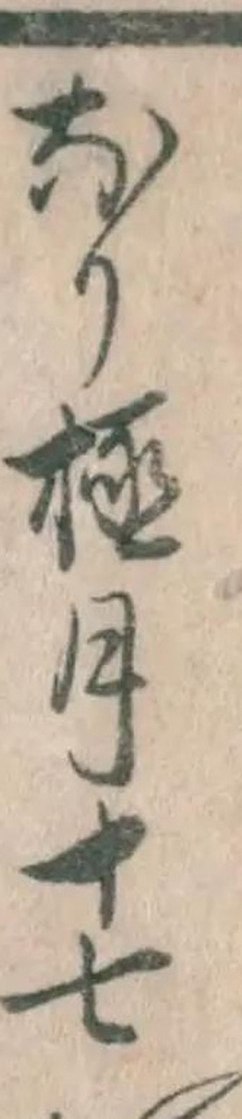なり極月十七
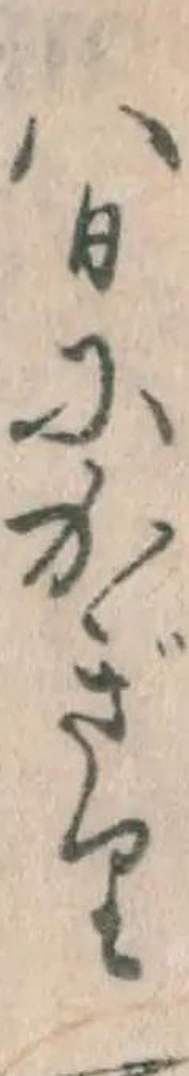八日にかぎり
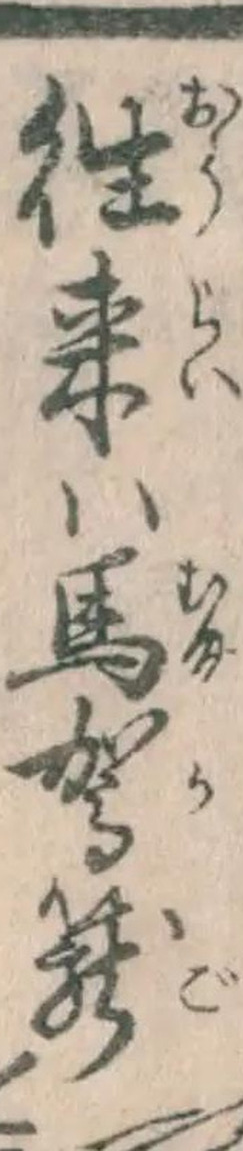往来は馬駕籠を
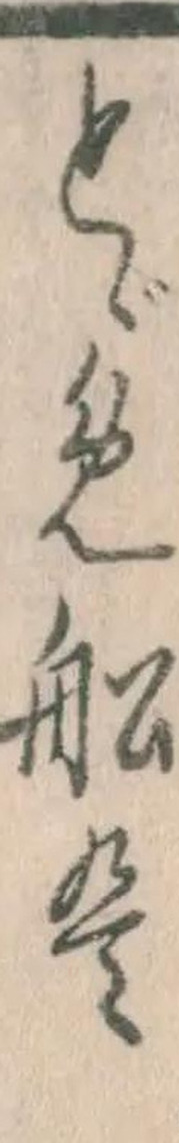とゞめ船は
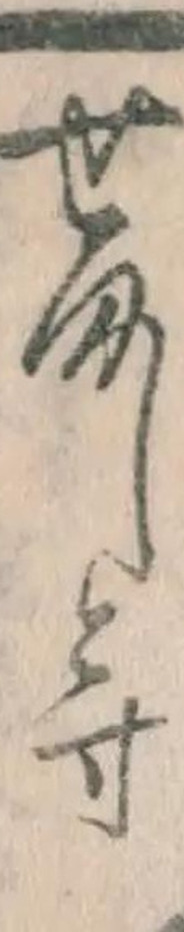せましとす
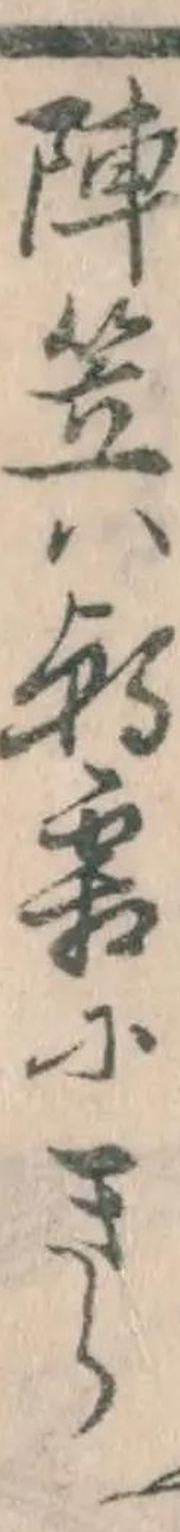陣笠は朝霜にきら
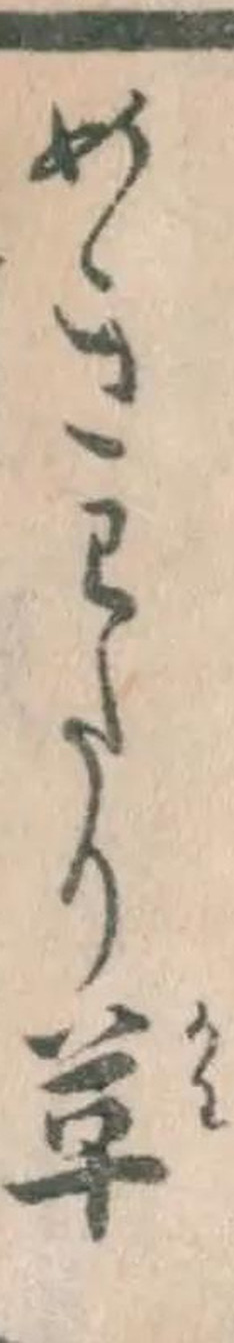めきわたり革
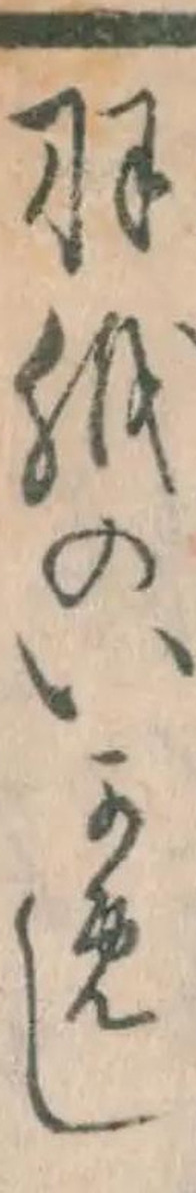羽織のいかめし
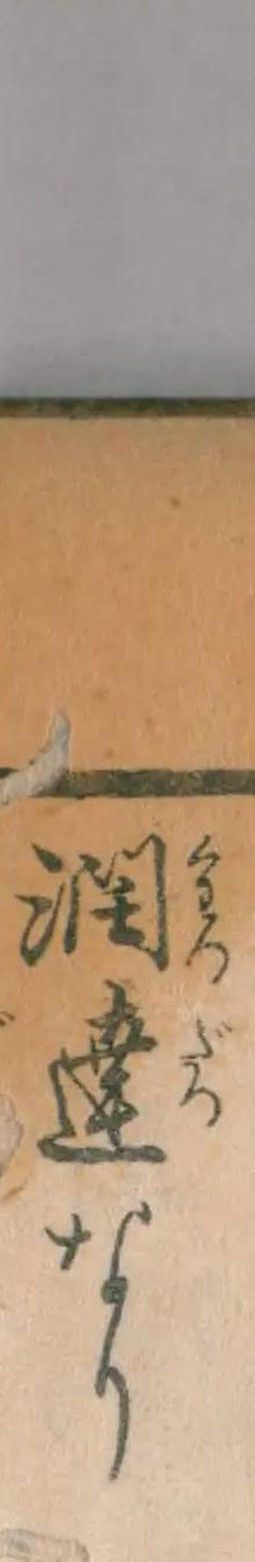潤達なり
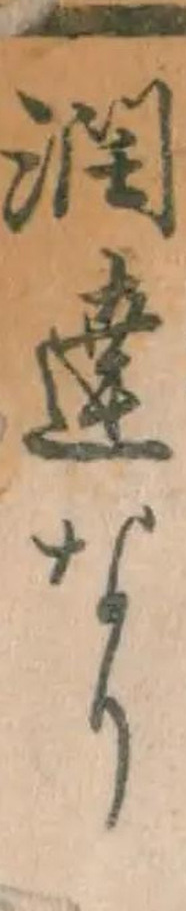潤達なり
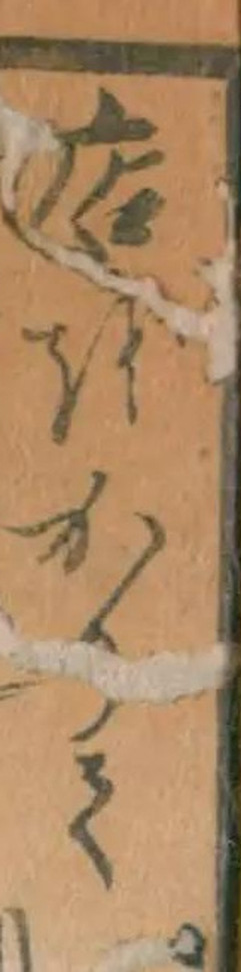店をかりて
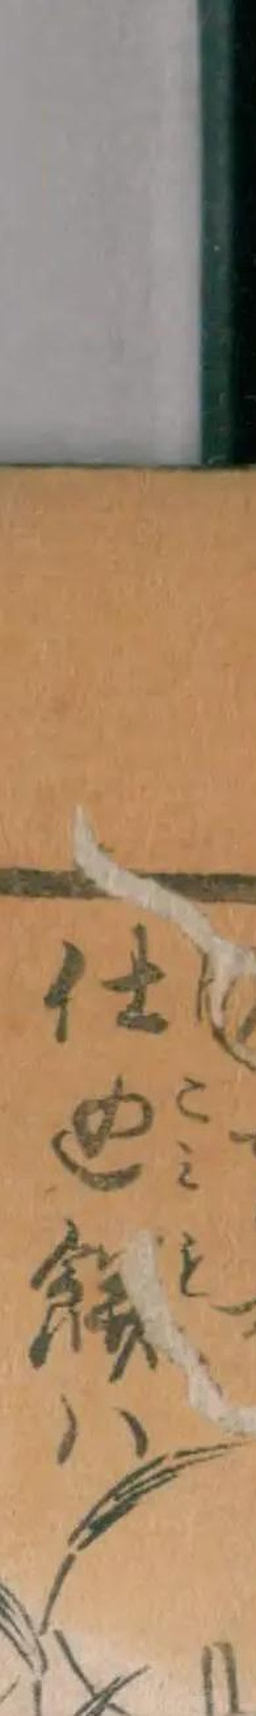仕込餅は
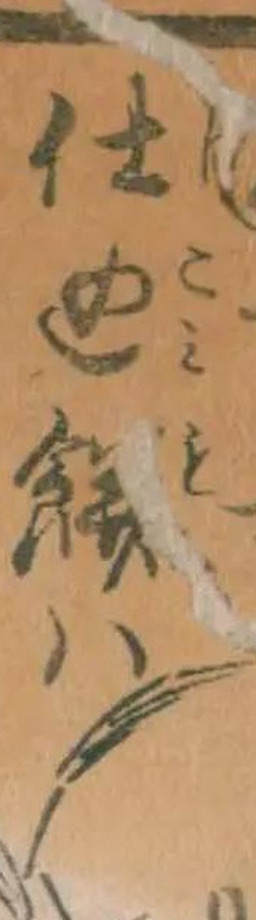仕込餅は
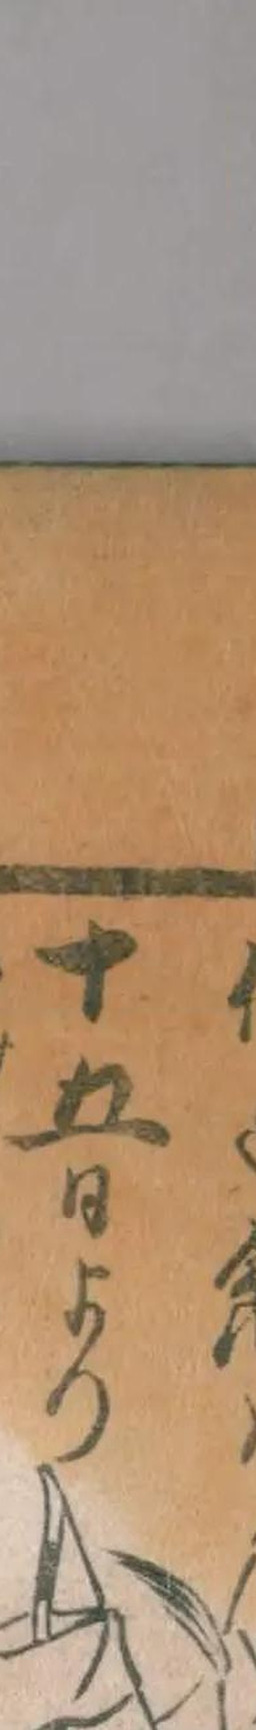十五日より
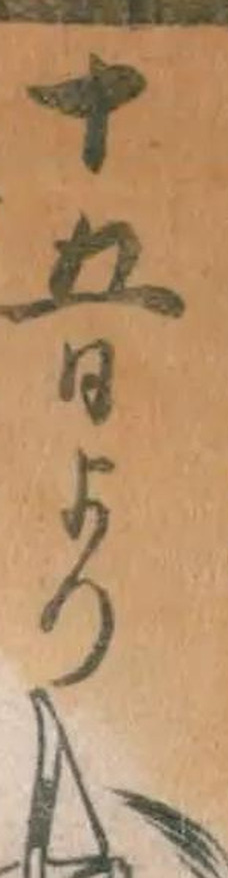十五日より
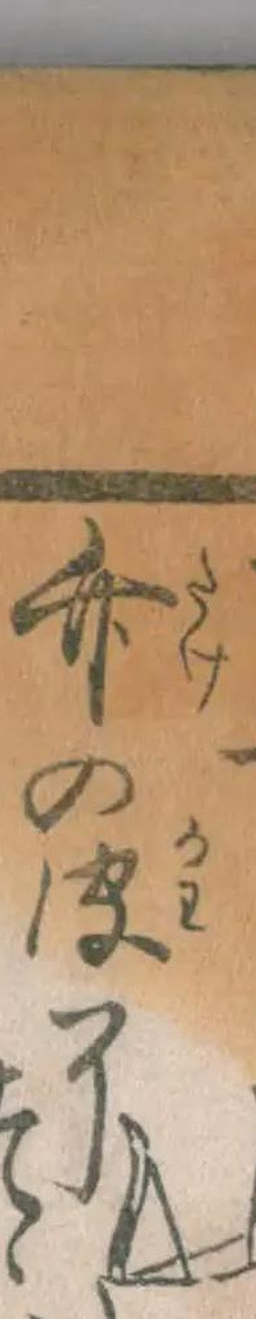竹の皮に
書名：絵本物見岡
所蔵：国立国会図書館 National Diet Library, JAPAN
